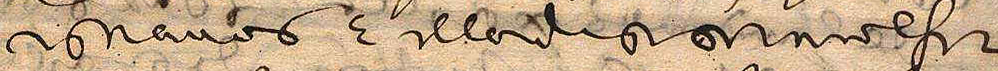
escrauos E ella dise ser molher
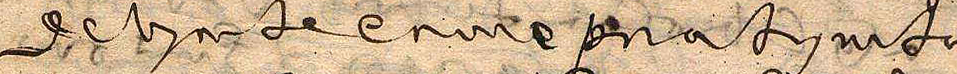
de vjnte e noue pera trjmta
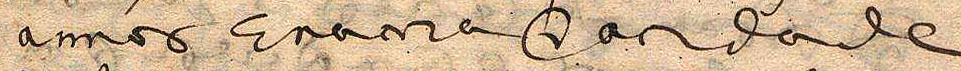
annos E nacera e̅ a cidade
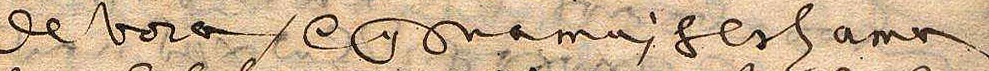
devora / e q̅ sua may se chama
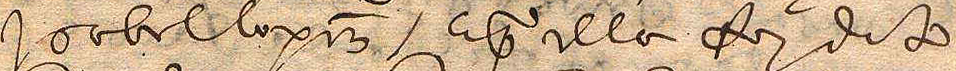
Jsabel lope̅z / E p̅o ella foj dito
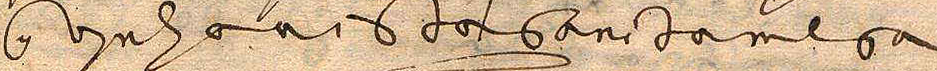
q̅ vjnha a esta sancta mesa
